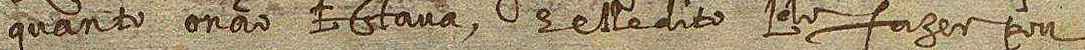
quanto o não Estaua, E elle dito Ldo fazer pou
